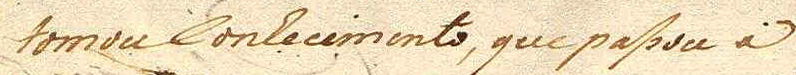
tomou Conhecimento, que passou a
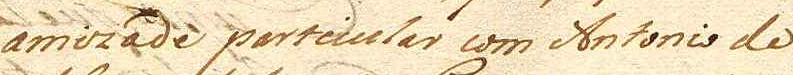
amizade particular com Antonio de
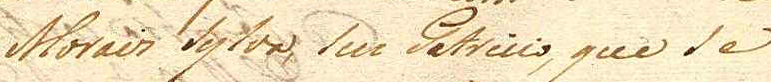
Morais Sylva, seu Patricio, que se
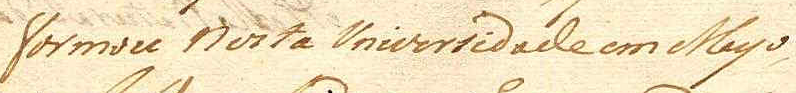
formou nesta Universidade em Mayo,
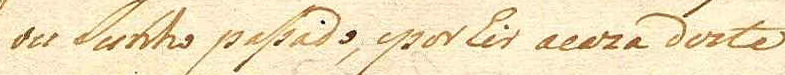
ou Iulho passado, e por hir a caza deste
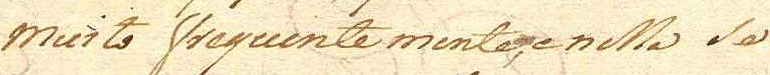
muito frequentemente, e nella se
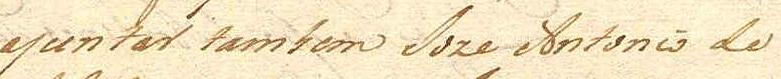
ajuntar tambem Ioze Antonio de
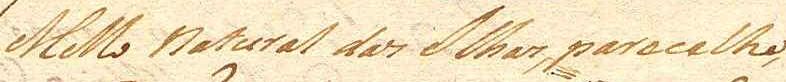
Mello natural das Ilhas, parecelhe,
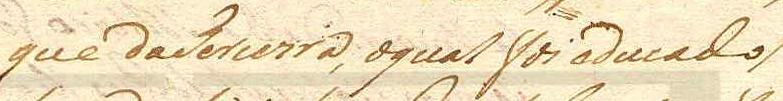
que da Terceira, o qual foi educado/
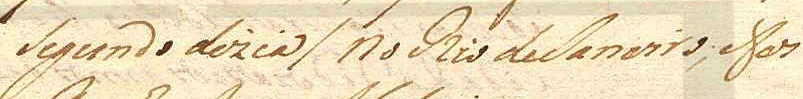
segundo dizia / no Rio de Ianeiro, e foi
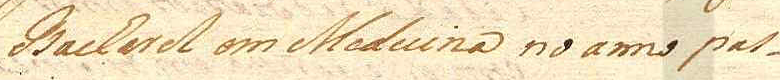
Bacharel em Medicina no anno pas
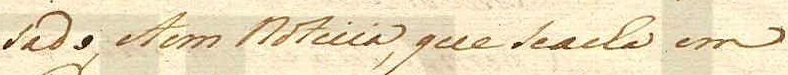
sado, e tem noticia, que se acha em
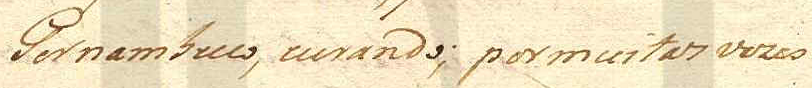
Pernambuco, curando; por muitas vezes
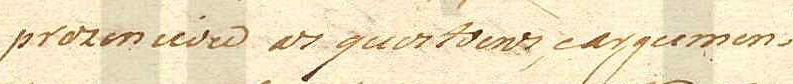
prezenciou as questoens e argumen
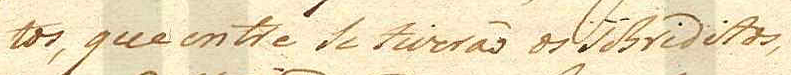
tos, que entre si tiveraõ os sobridittos,
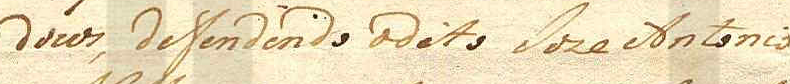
dous, defendendo o dito Ioze Antonio
